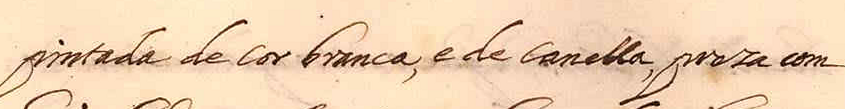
pintada de cor branca, e de canella, preza com
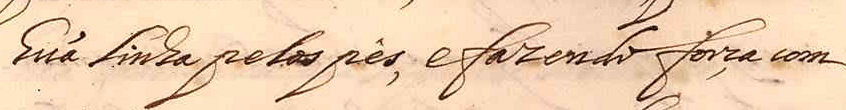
huā linha pelos pés, e fazendo força com
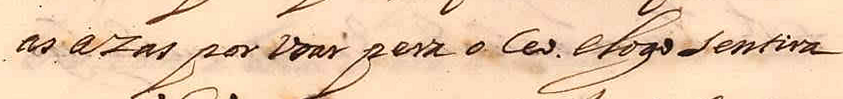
as azas por voar pera o Ceo. e logo sentira
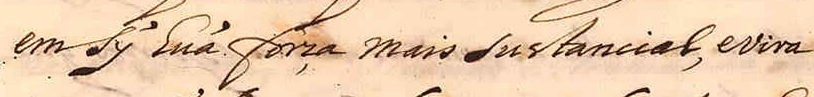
em sy huā força mais sustancial, e vira
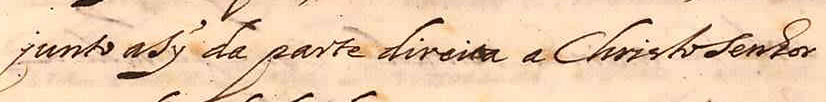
junto a sy da parte direita a Christo Senhor
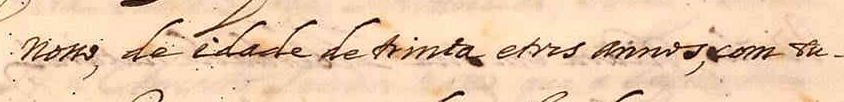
nosso, de idade de trinta e tres annos, com tu
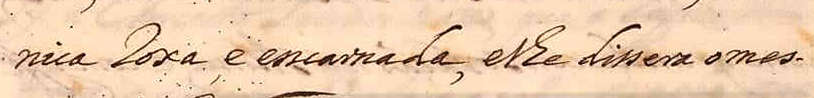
nica Roxa, e encarnada, e lhe dissera o mes
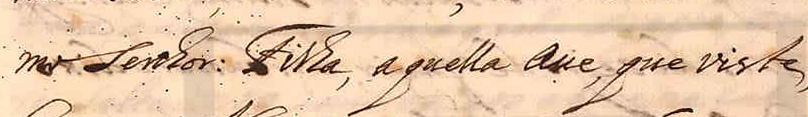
mo senhor. Filha, aquella aue, que viste,
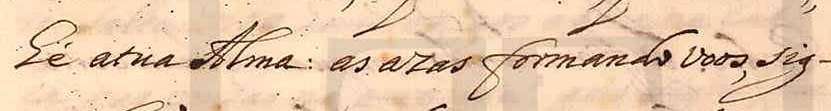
hé a sua Alma: as azas formando voos, sig
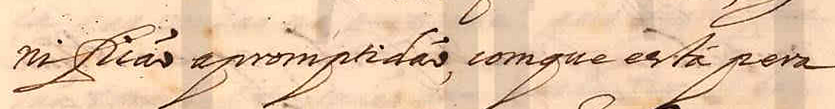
nificaõ a promptidaõ, com que está pera
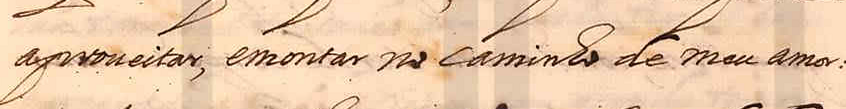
aproueitar, e montar no caminho de meu amor:
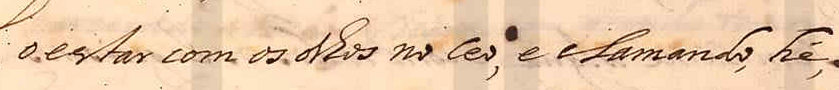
o estar com os olhos no Ceo, e clamando, hé,
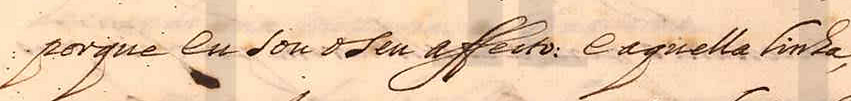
porque eu sou o seu affecto. e aquella linha,
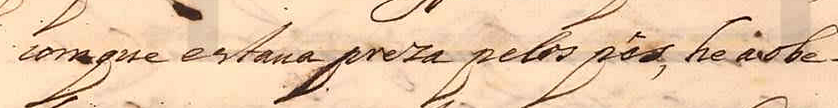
com que estaua preza pelos pês, he a obe
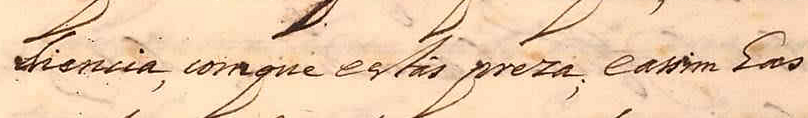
diencia, com que estás preza; e assim has
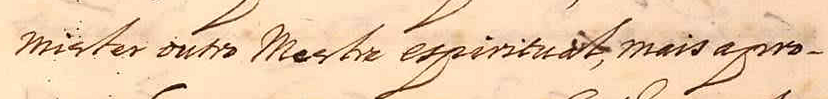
mister outro Mestre espiritual, mais apro
